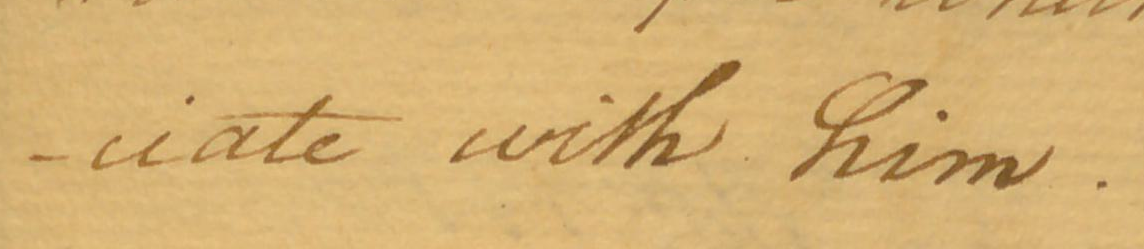-ciate with him.
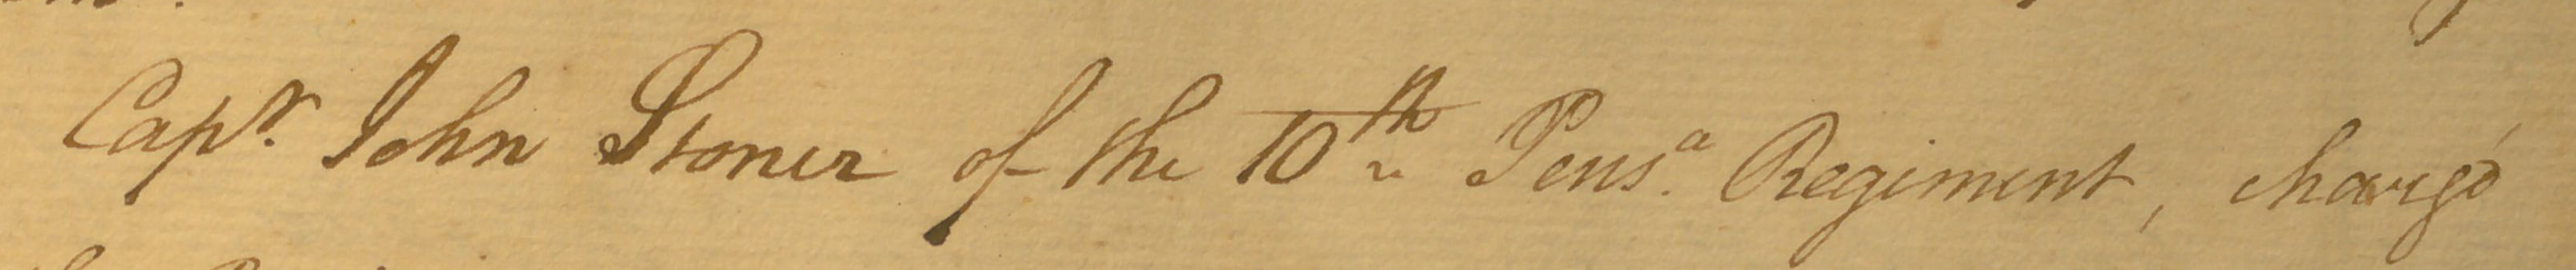Cap^t. John Stoner of the 10^th. Pens^a. Regiment, charg'd
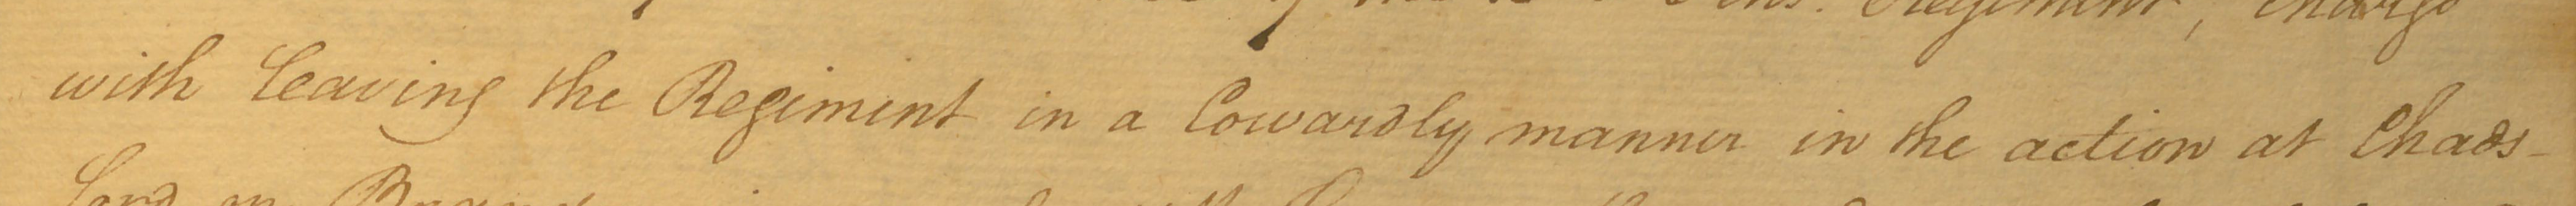with leaving the Regiment in a Cowardly manner in the action at Chads-
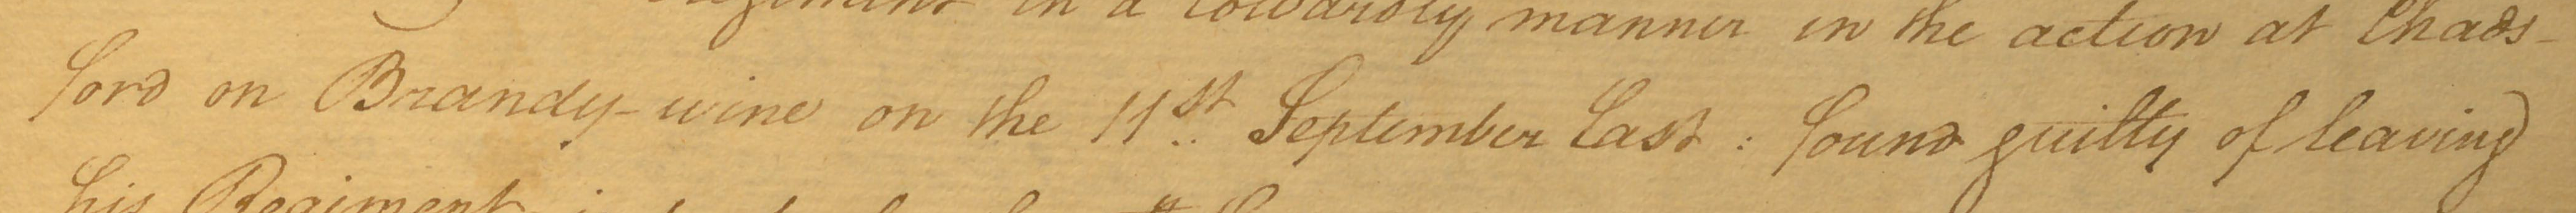ford on Brandy-wine on the 11^st September last: found guilty of leaving
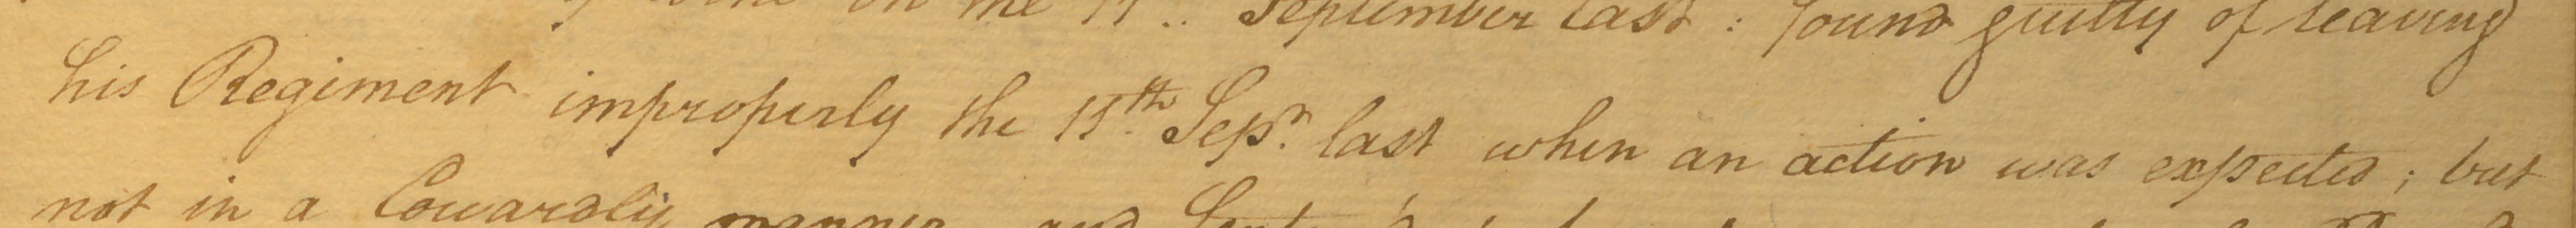his Regiment improperly the 11^th. Sep^r. last when an action was expected; but
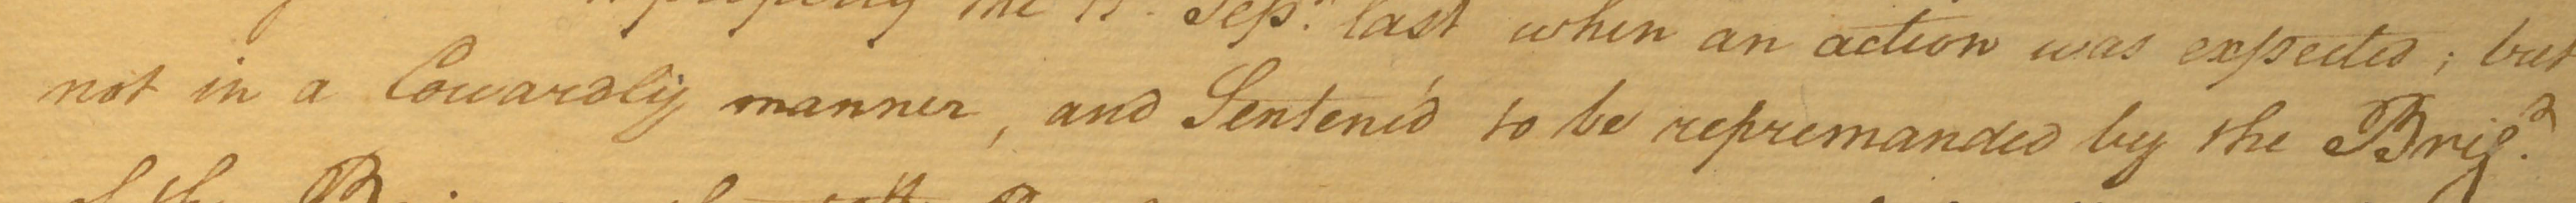not in a Cowardly manner, and Sentenc'd to be repremanded by the Brig^r.
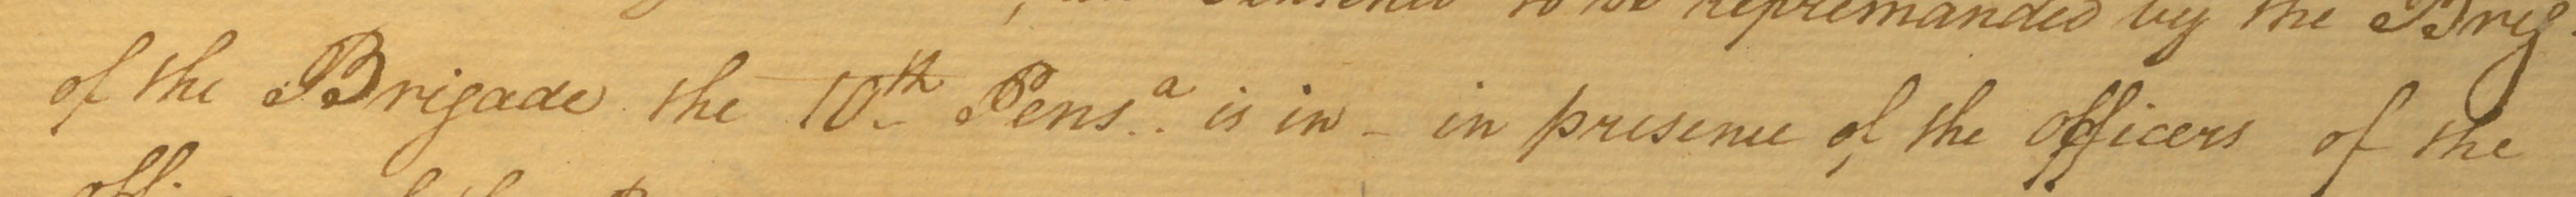of the Brigade the 10^th. Pens^a. is in- in the presence of the officers of the
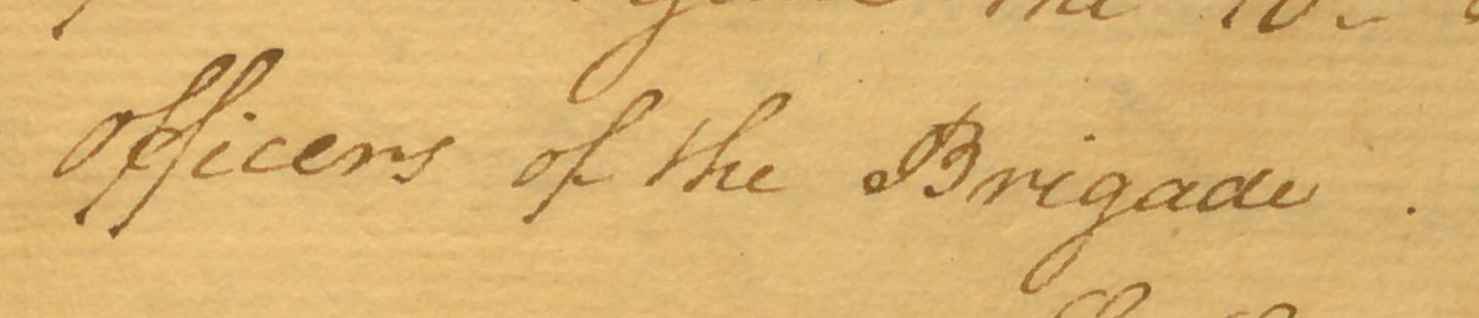officers of the Brigade.
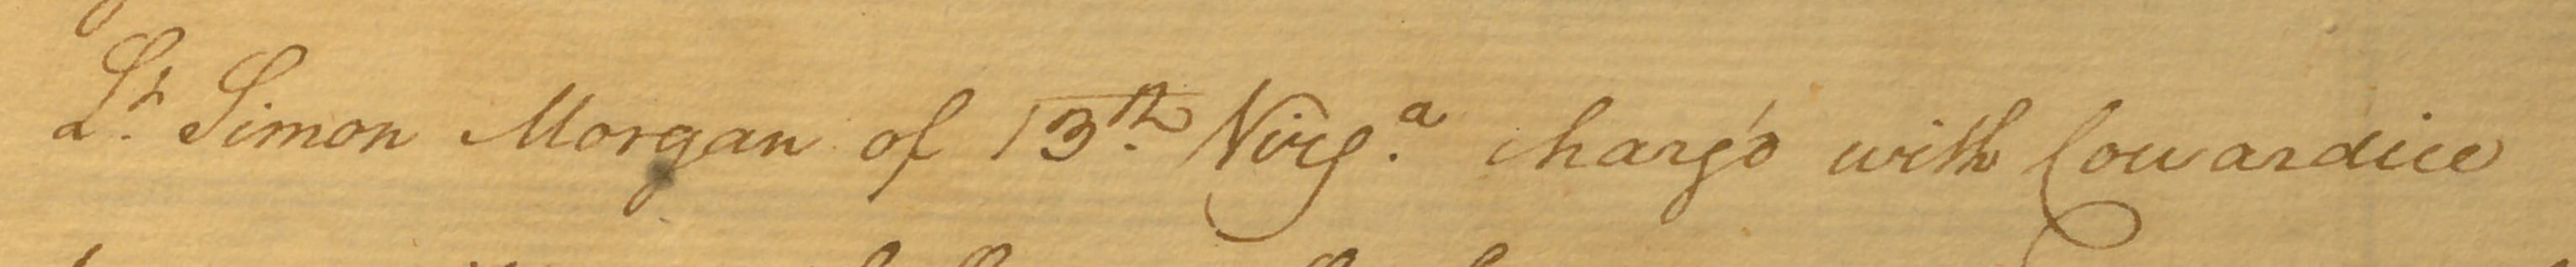L^t. Simon Morgan of 13^th. Virg^a. charg'd with Cowardice
